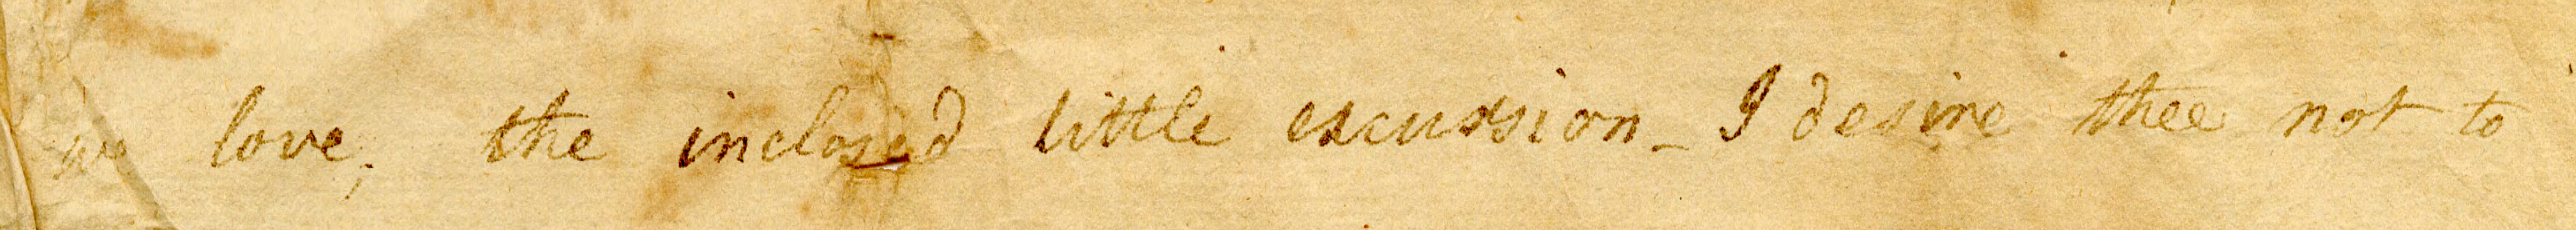we love the inclosed little excursion- I desire thee not to
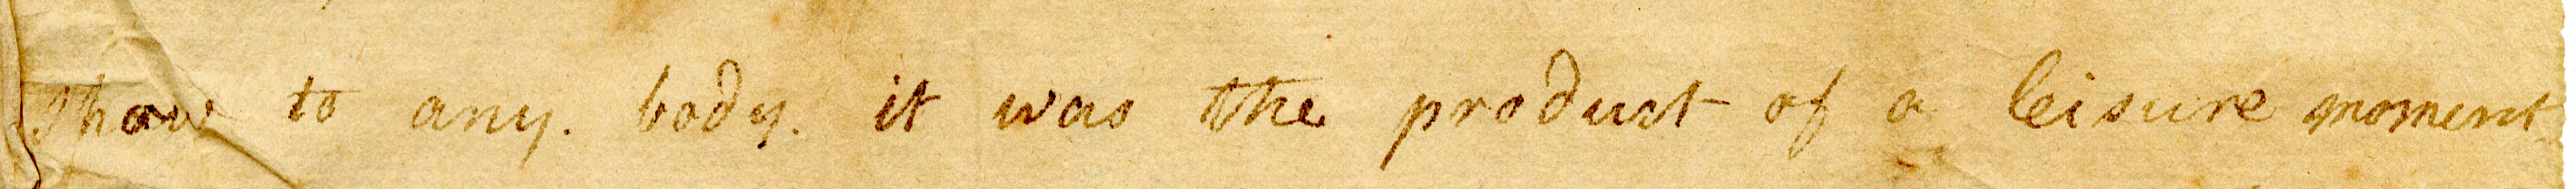shew to any body it was the product of a leisure moment
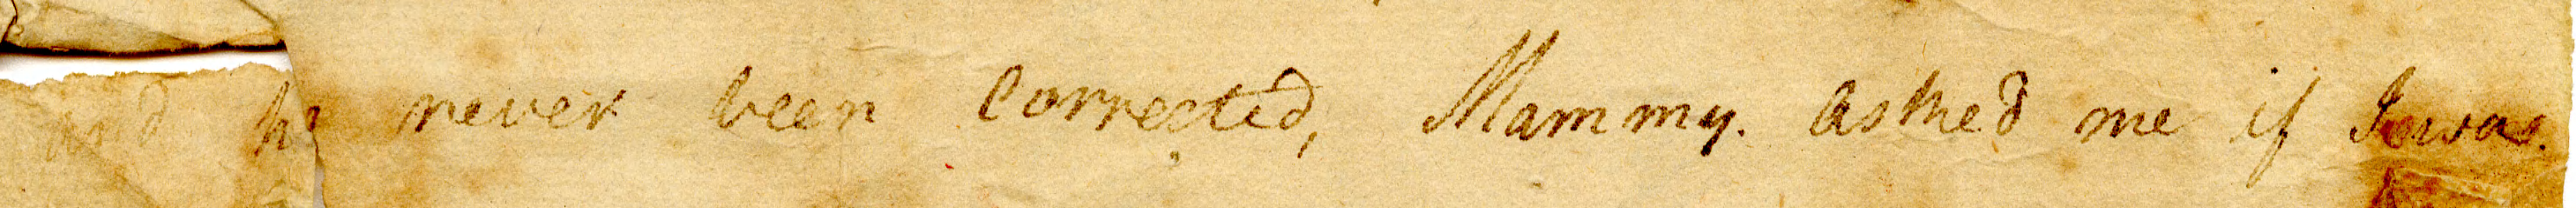and h[_] never been corrected, Mammy asked me if I was
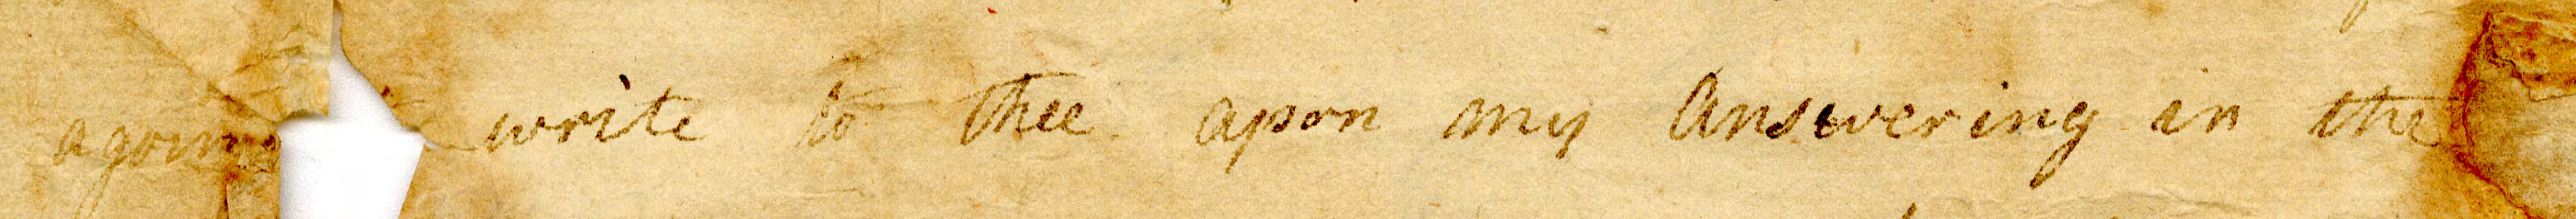agoin [_] write to thee upon my answering in the
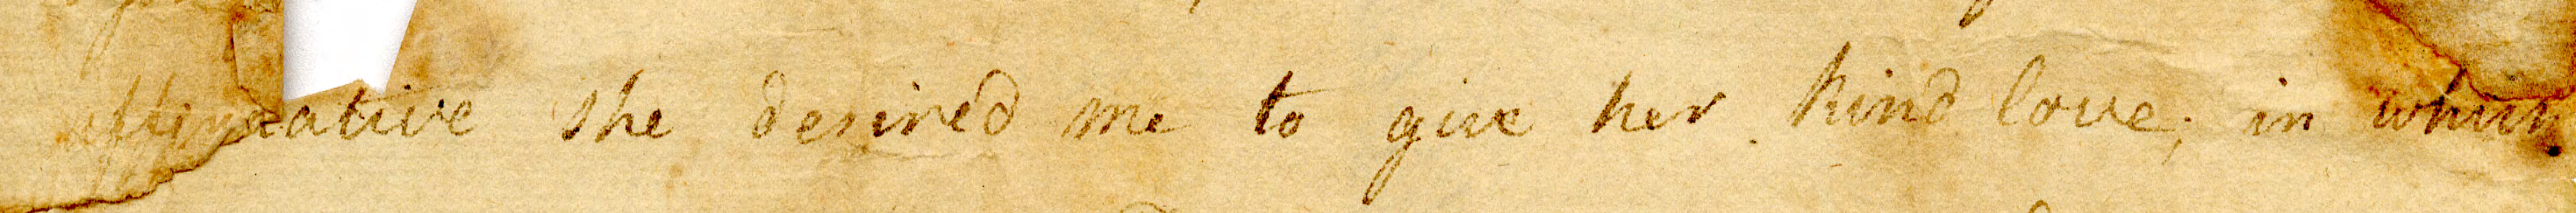affirmative she desired me to give her kind love; in which
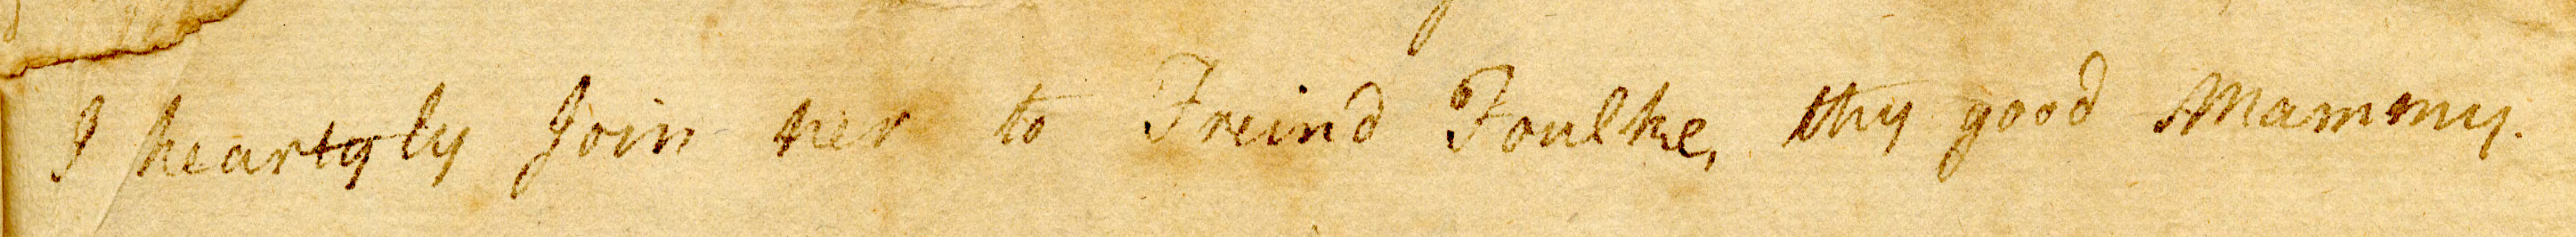I heartyly Join her to Friend Foulke, thy good Mammy.
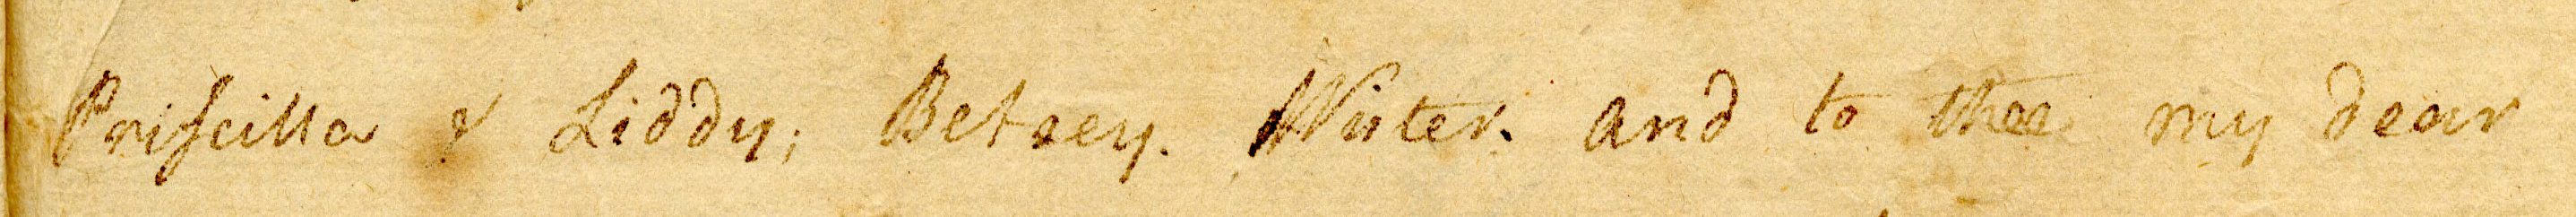Priscilla & Liddy Betsey Wister and to thee my dear
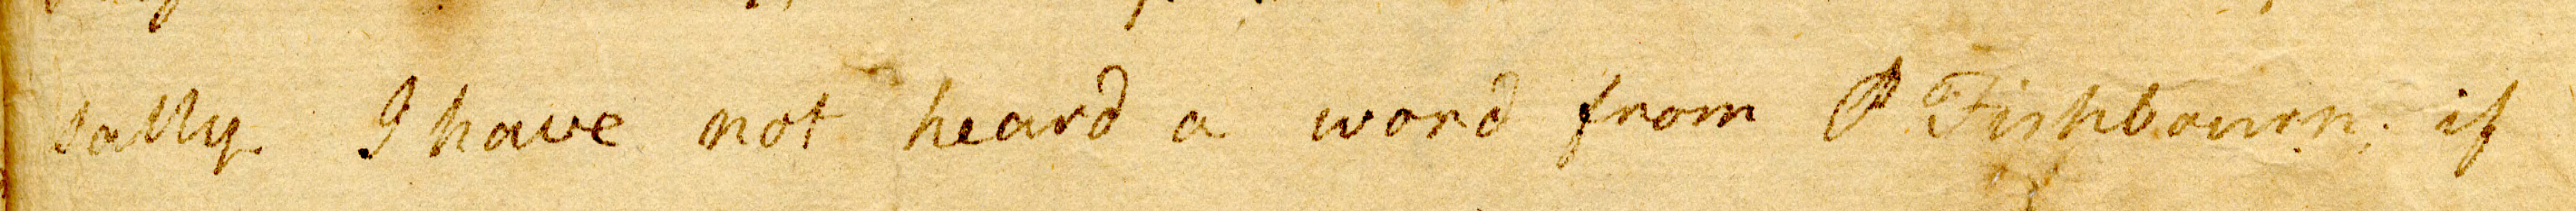Sally I have not heard a word from P Fishbourne if
